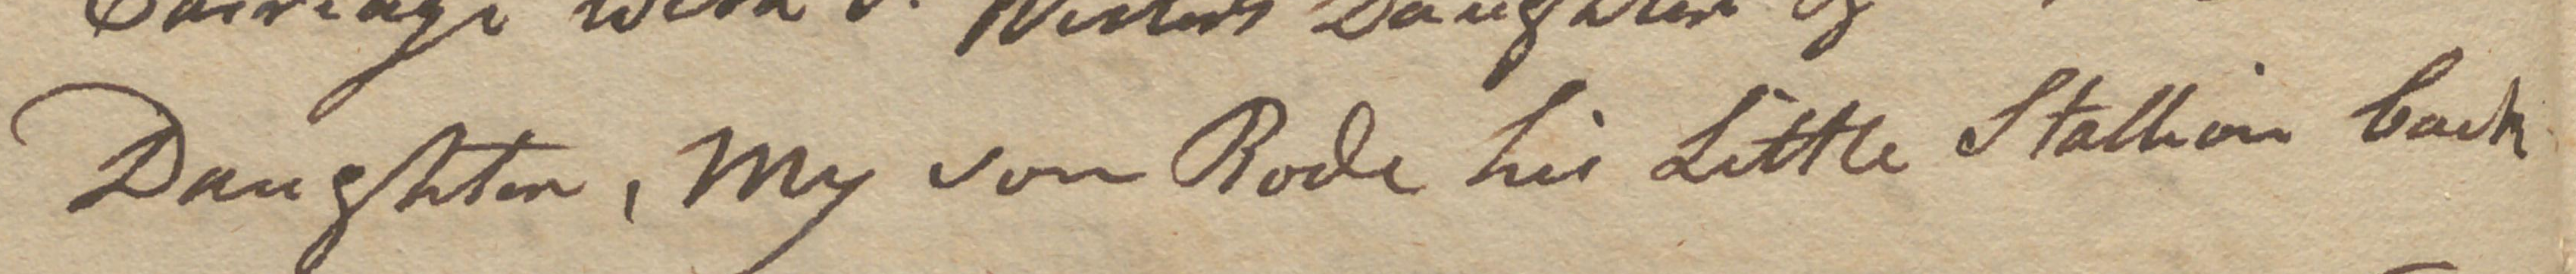Daughter, My son Rode his Little Stallion back
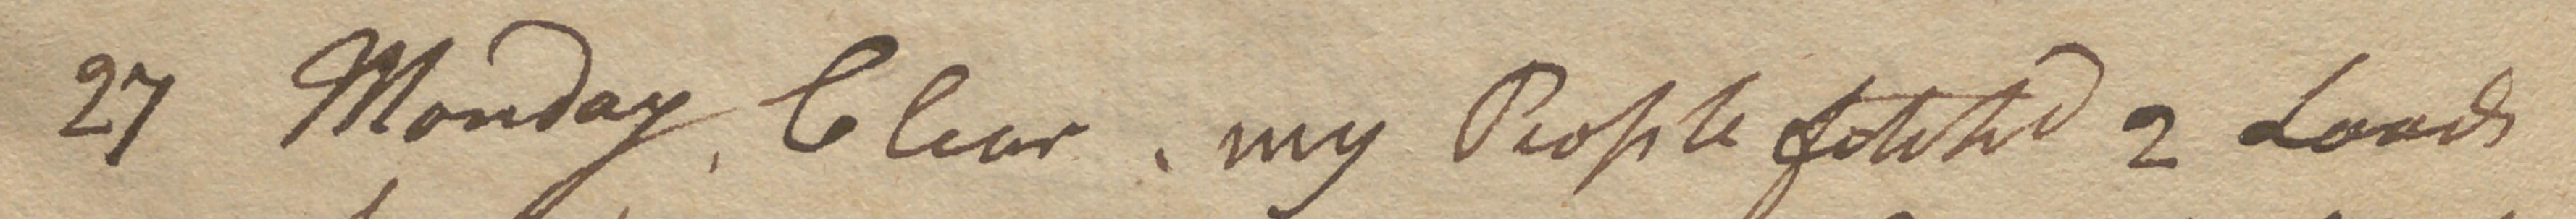27 Monday, Clear my People fetchd 2 Loads
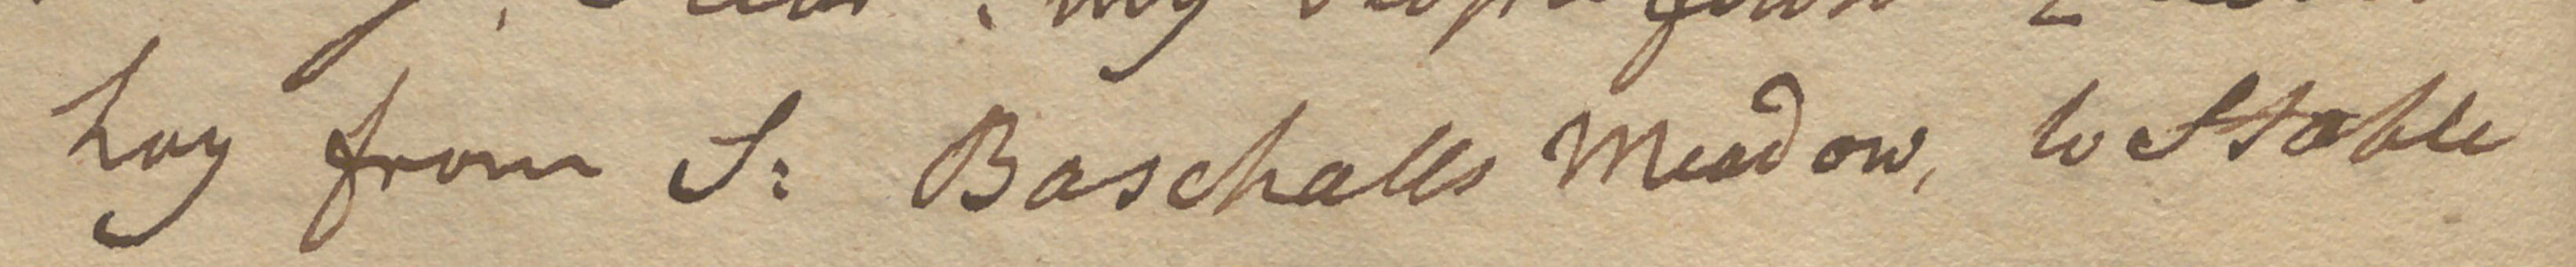hay from S: Baschalls Meadow, to Stable
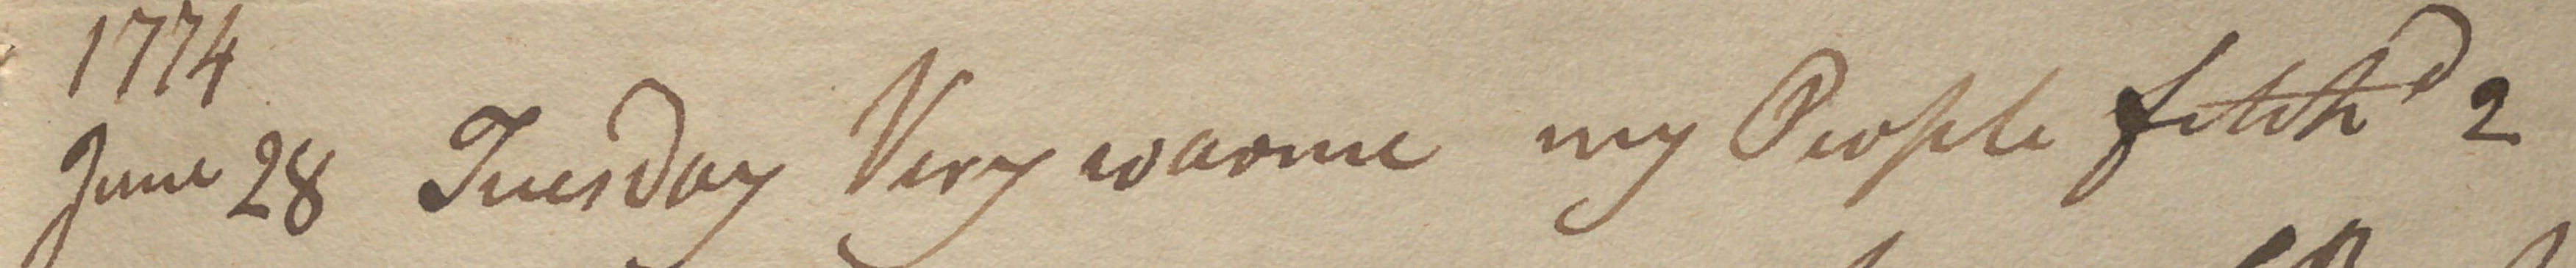June 28 Tuesday Very warme my People fetch^d 2
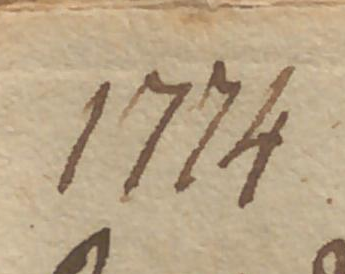1774
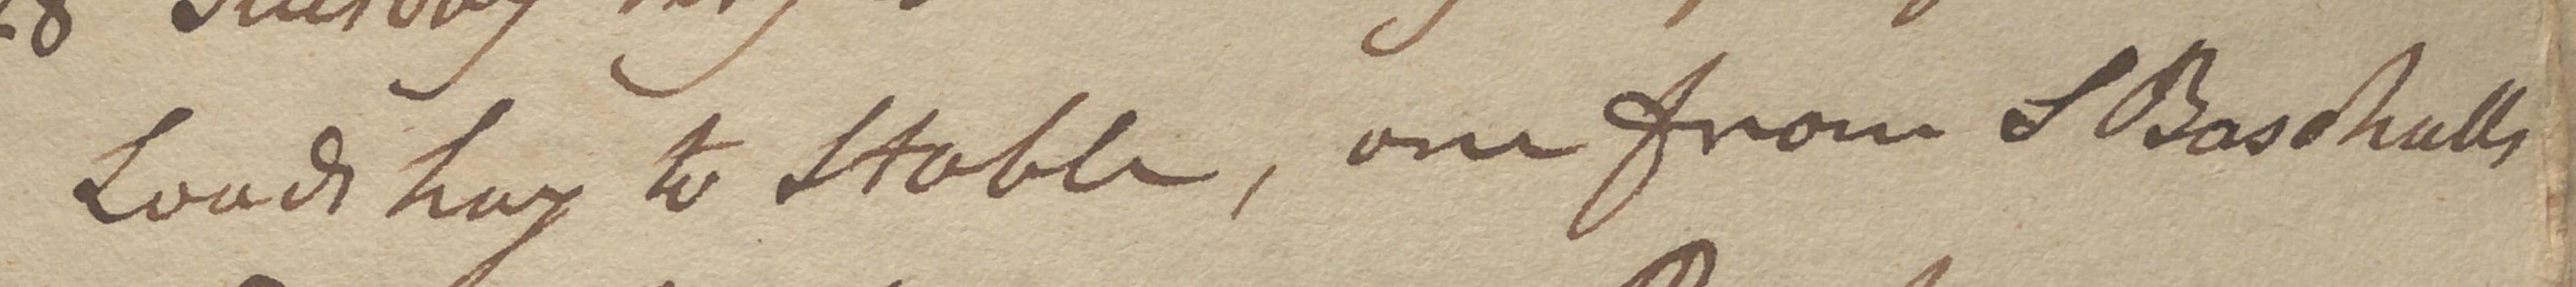Loads hay to Stable, one from S Baschalls
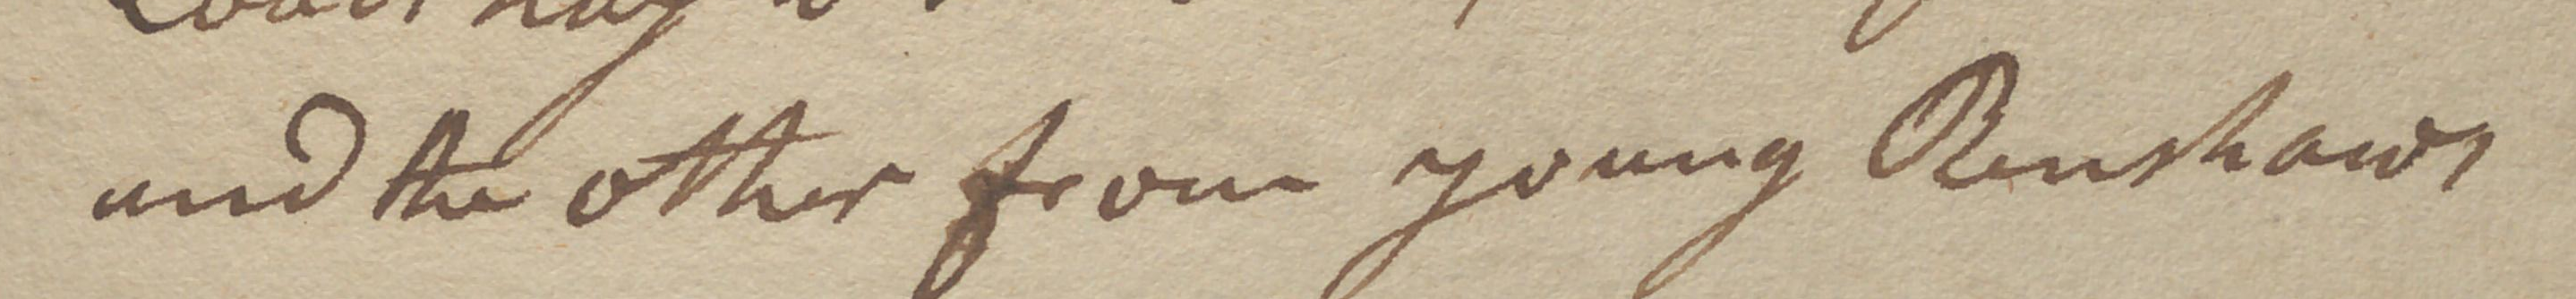and the other from young Renshaws
